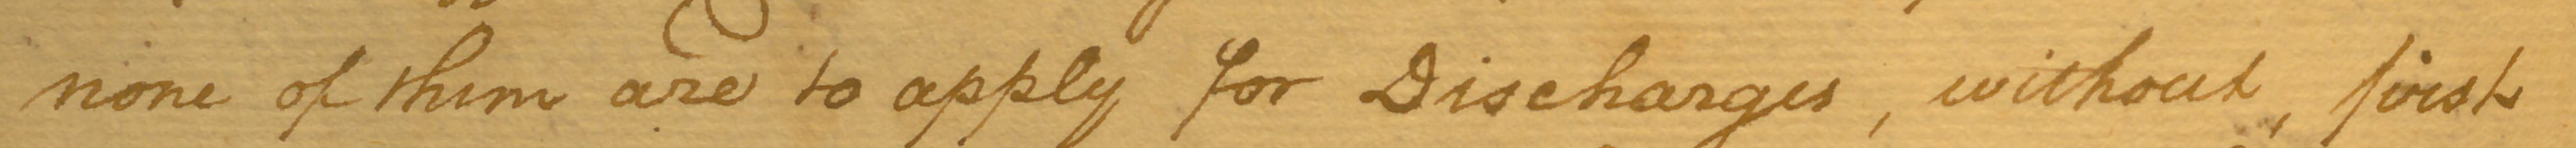none of them are to apply for Discharges, without first
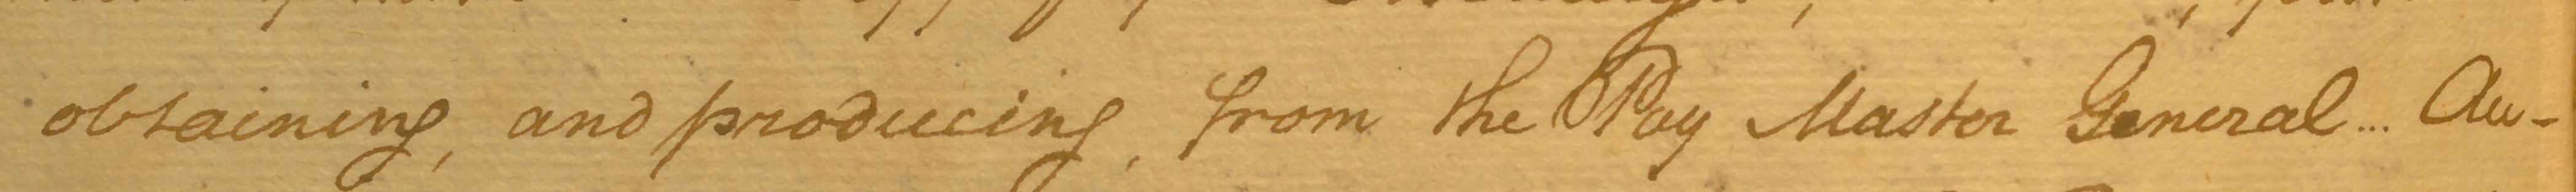obtaining, and producing from the Pay Master General... Au-
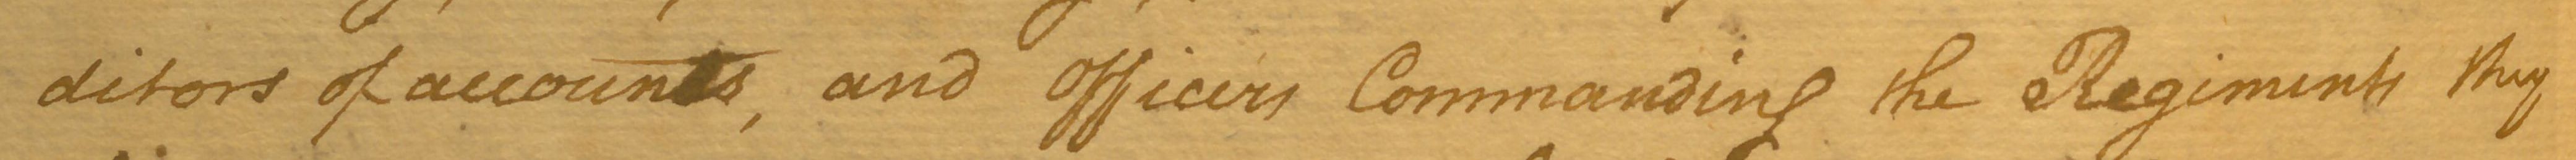ditors of accounts, and officers Commanding the Regiment they
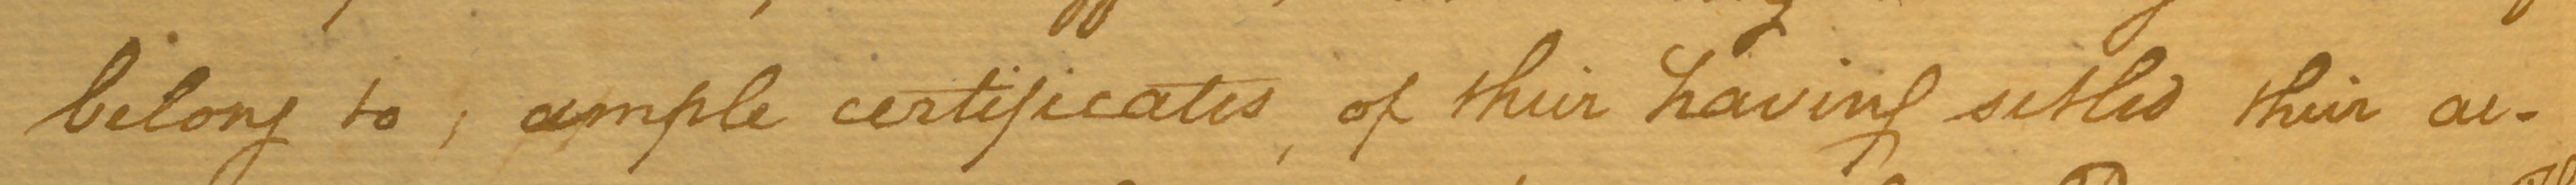belong to, ample certificates of their having setled their ac-
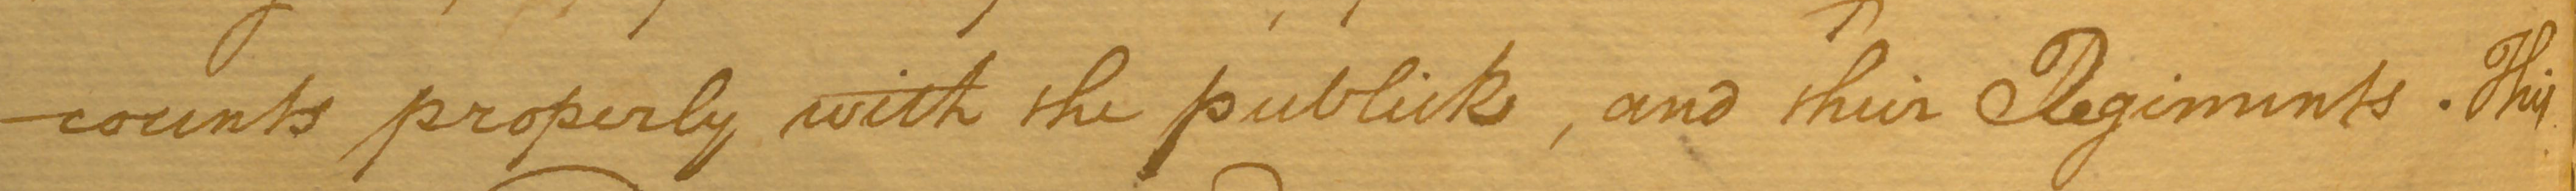-counts properly with the publick, and their Regiments. This
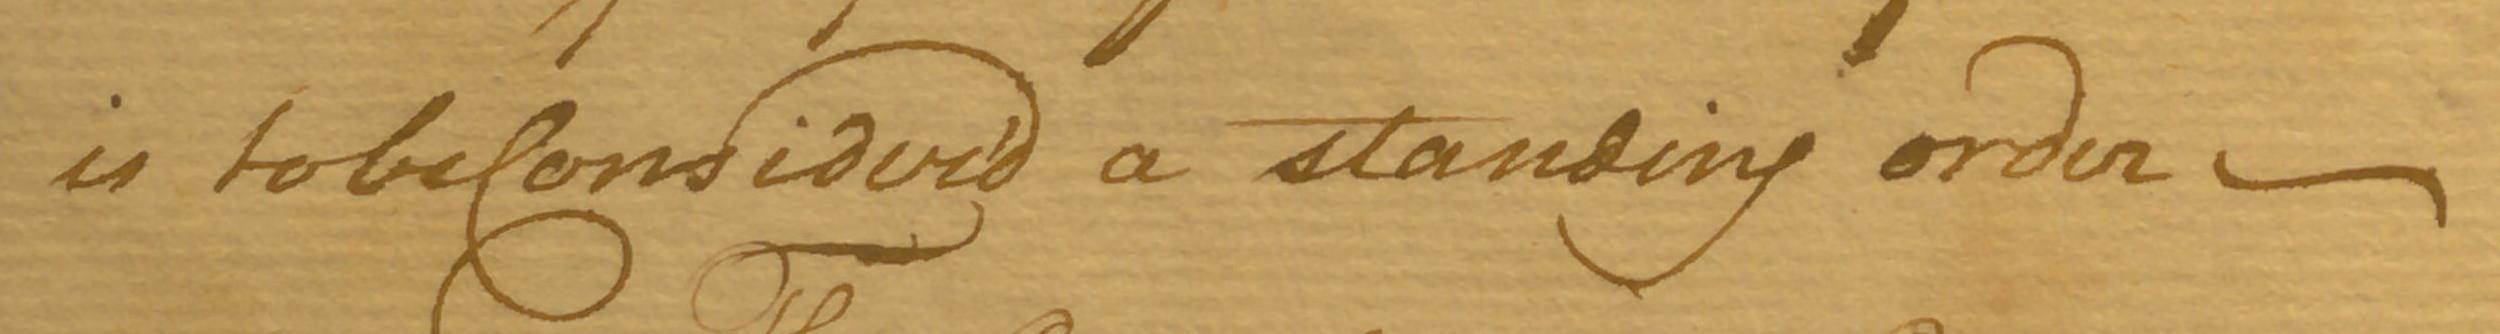is to be Consider'd a standing order-
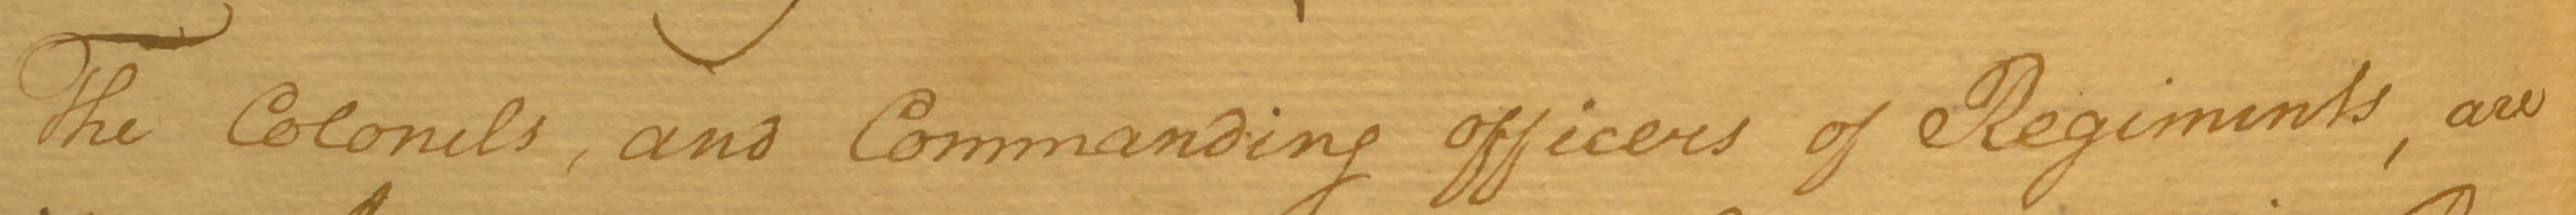The Colonels, and Commanding officers of Regiments, are
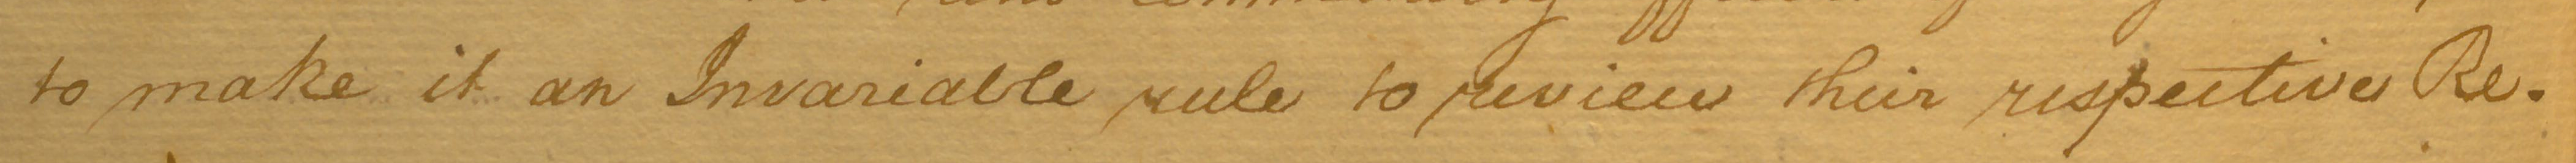to make it an Invariable rule to review their respective Re-
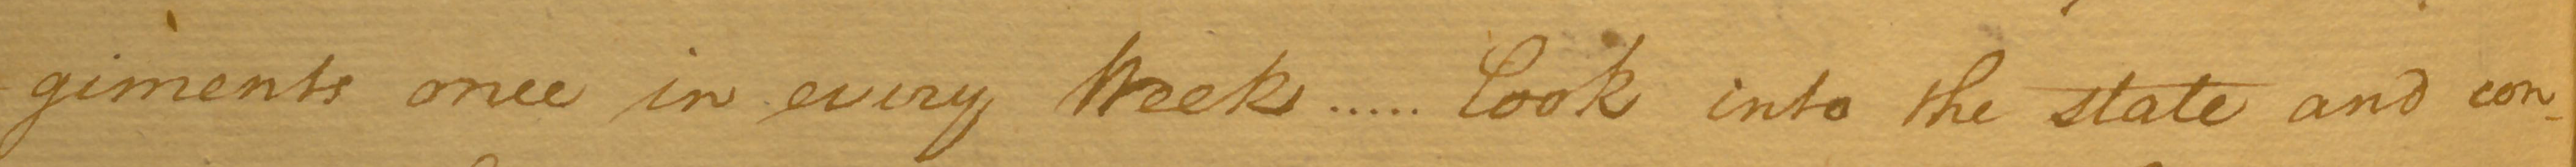giments once in every Week... look into the state and con
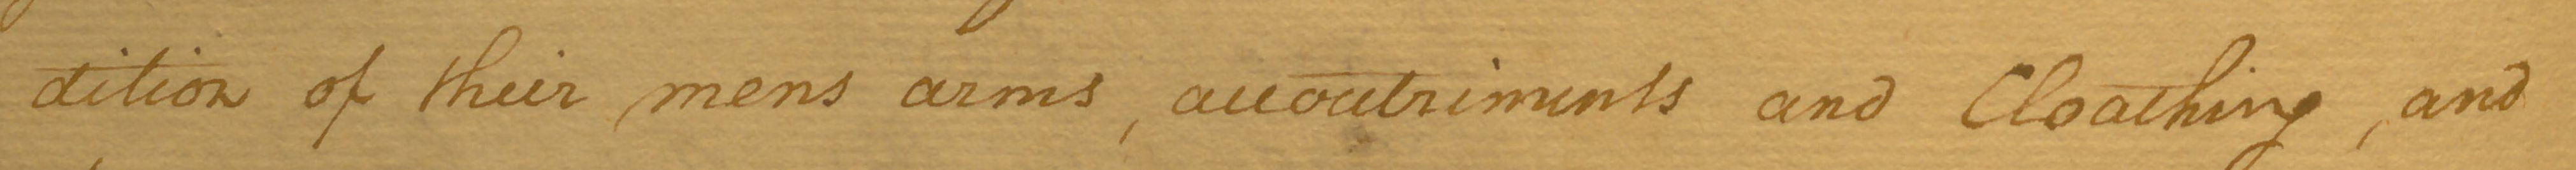dition of their mens arms, accoutriments and Cloathing, and
